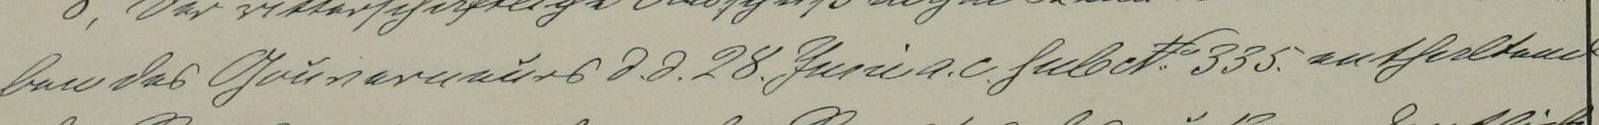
ben des Gouverneurs d.d. 28. Juni a.c. sub No. 335, enthaltend
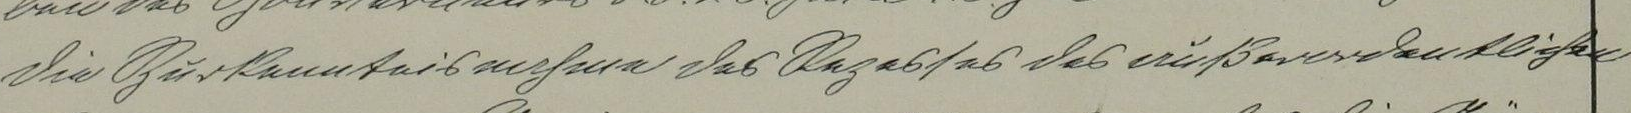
die Zurkenntnisnahme des Rezesses des außerordentlichen
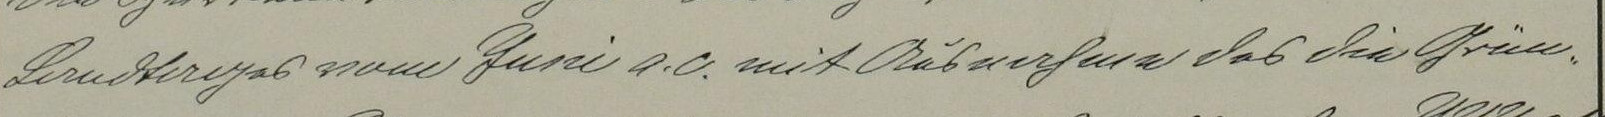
Landtages vom Juni a.c. mit Ausnahme des die Grün-
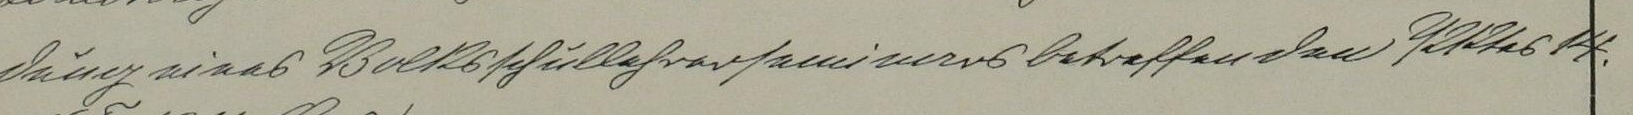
dung eines Volksschullehrerseminars betreffenden Pktes 14.
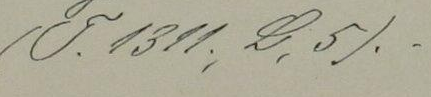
(T.1311; L.5).
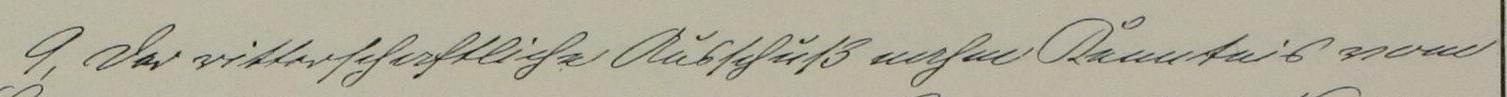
9. Der ritterschaftliche Ausschuß nahm Kenntnis vom
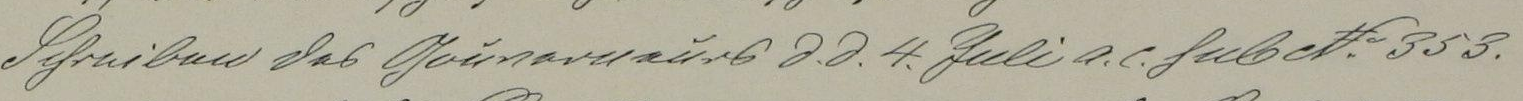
Schreiben des Gouverneurs d.d. 4. Juli a.c. sub No. 353,
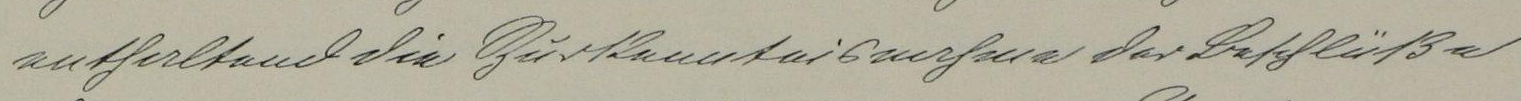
enthaltend die Zurkenntnisnahme der Beschlüße
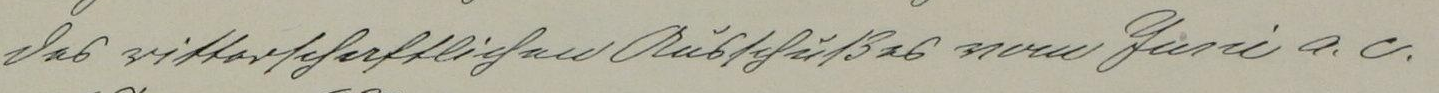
des ritterschaftlichen Ausschußes vom Juni a.c.
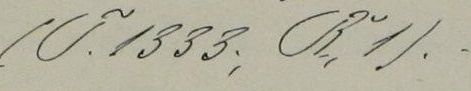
(T.1333; R.1).
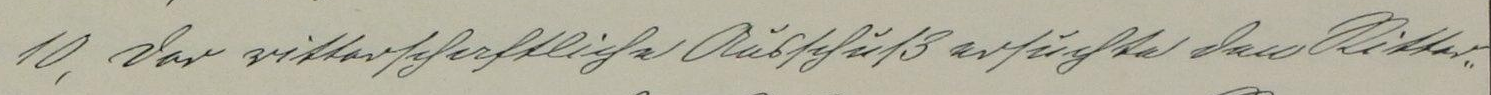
10. Der ritterschaftliche Ausschuß ersuchte den Ritter-
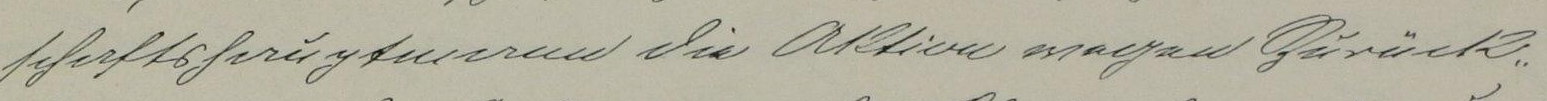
schaftshauptmann die Aktion wegen Zurück-
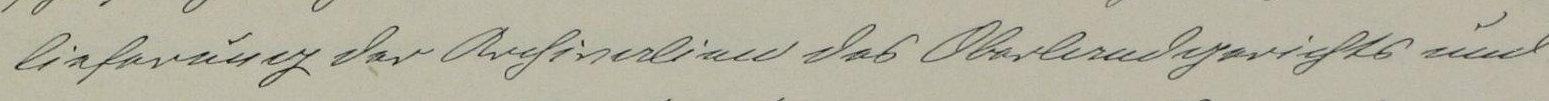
lieferung der Archivalien des Oberlandgerichts und
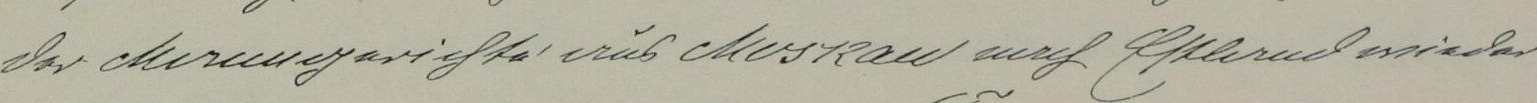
der Manngerichte aus Moskau nach Estland wieder
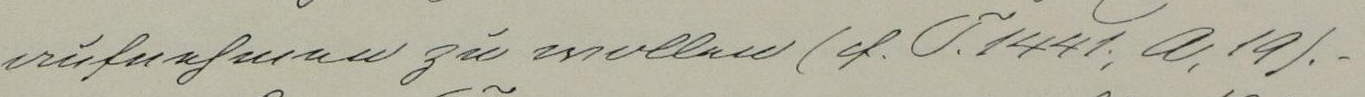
aufnehmen zu wollen (cf. T.1441; A.19).
